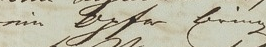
ein Opfer bringen;
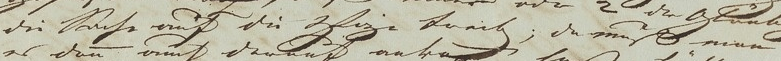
die Sache auf die Spize treiben; da muß man
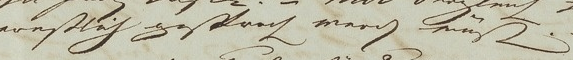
ernstlich gesprochen werden müßen. –
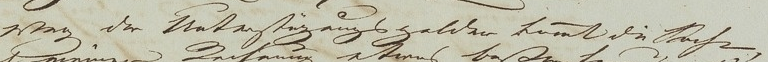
Wegen der Unterstüzungsgelder kommt die Sache,
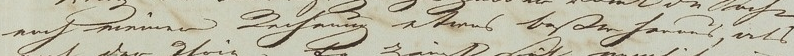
nach meiner Rechnung etwas beßer heraus, als
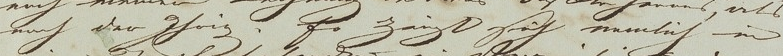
nach der Ihrigen. Es zeigt sich nemlich in
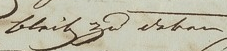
bleiben zu deken
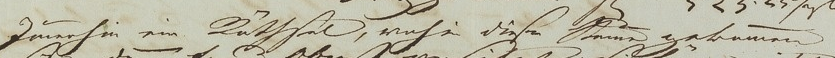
Immerhin ein Räthsel, wohin diese Summe gekommen
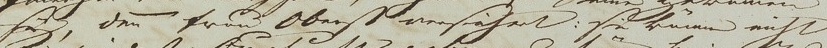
sey, denn Frau Oberst versichert: sie könne nicht
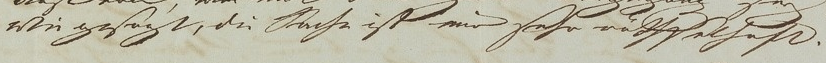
Wie gesagt, die Sache ist mir sehr räthselhaft.
